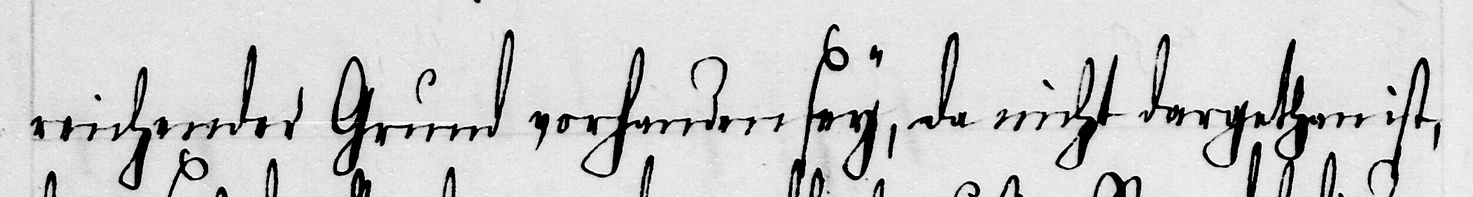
reichender Grund vorhanden sey, da nicht dargethan is¬
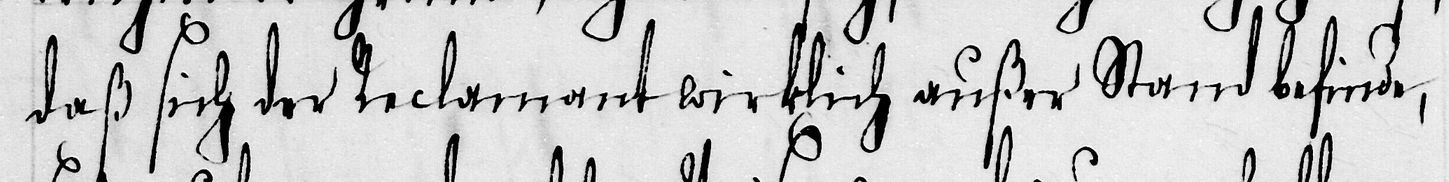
daß sich der Reclamant wirklich außer Stand befinde,
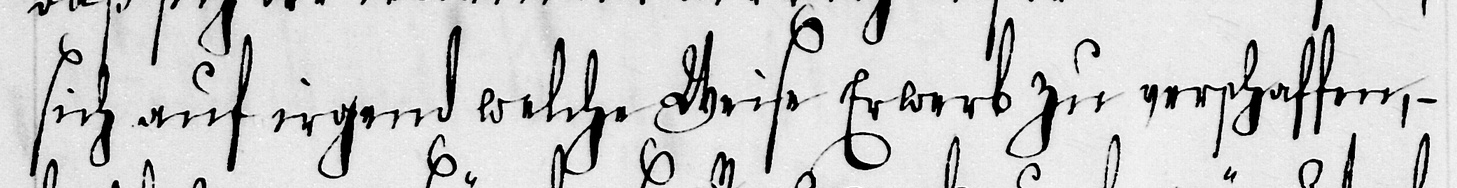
sich auf irgend welche Weise Erwerb zu verschaffen, –
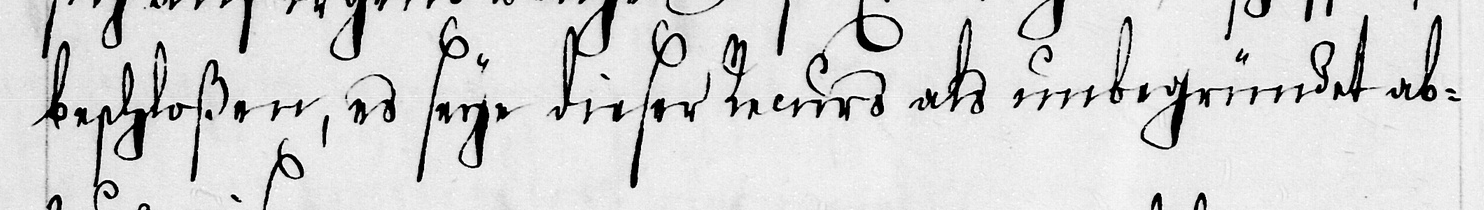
beschloßen, es seye dieser Recurs als unbegründet ab¬
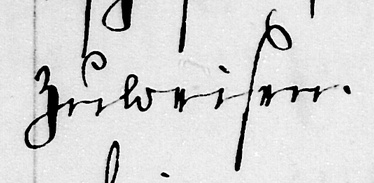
zuweisen.
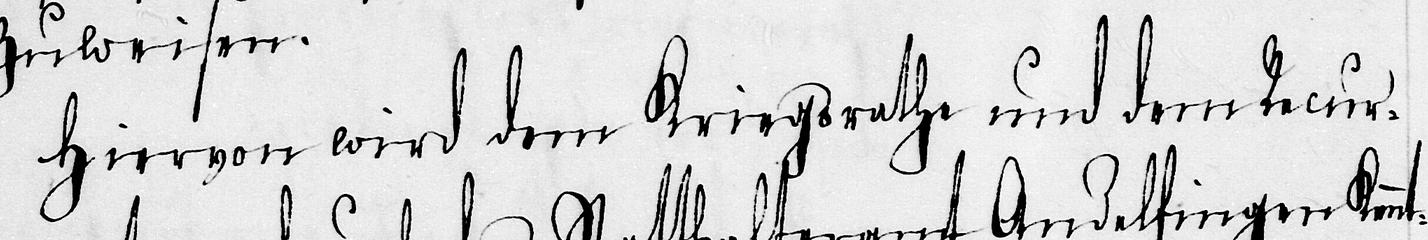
Hiervon wird dem Kriegsrathe und dem Recur¬
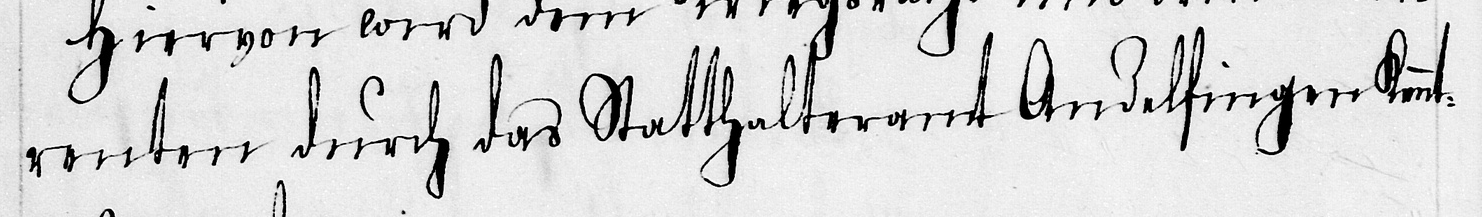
renten durch das Statthalteramt Andelfingen Ken¬
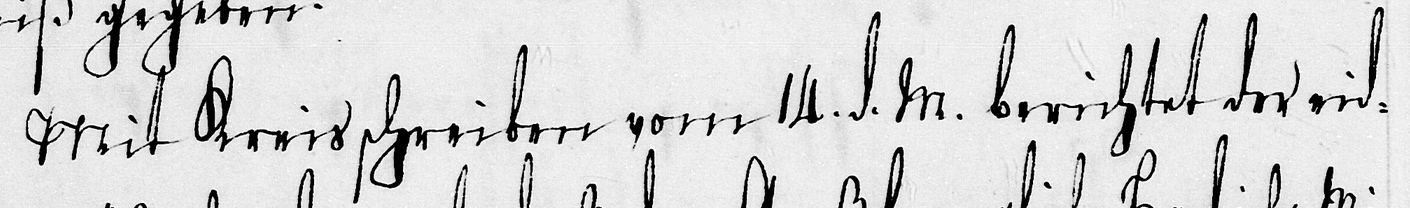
Mit Kreisschreiben vom 14. d. M. berichtet der eid¬
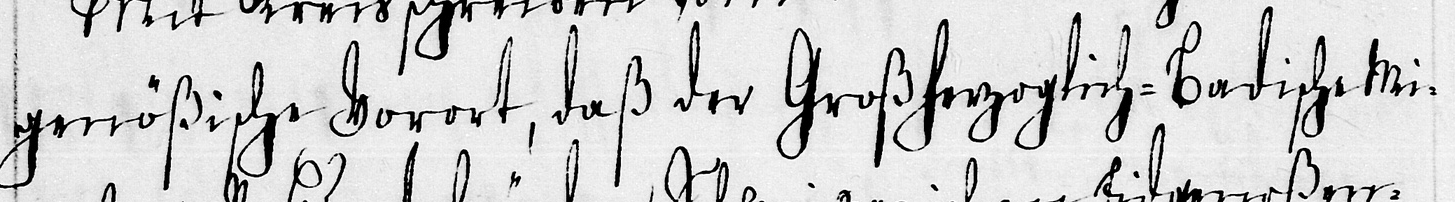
genößische Vorort, daß der Großherzoglich-Badische Mi¬
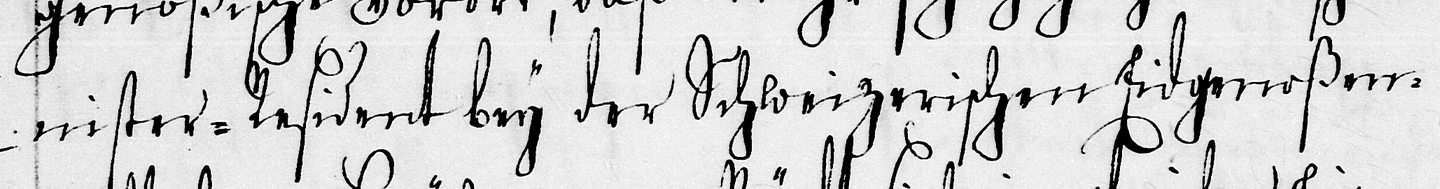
nister-Resident bey der Schweizerischen Eidgenoßens¬
